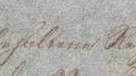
vorbehaltene
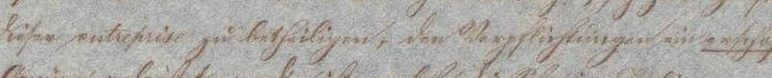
dieser entreprise zu betheiligen, den Verpflichtungen ein erschöpfendes
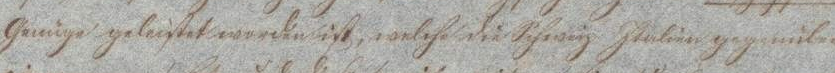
Genüge geleistet worden ist, welche die Schweiz Italien gegenüber
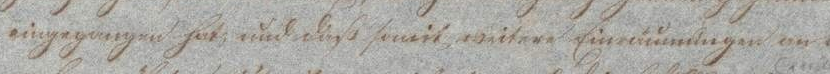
eingegangen hat, und daß somit weitere Einräumungen an
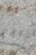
die
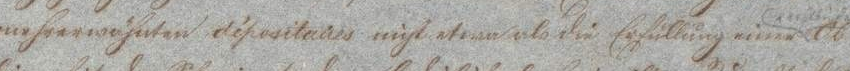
mehrerwähnten dépositaires nicht etwa als die Erfüllung einer Ob-
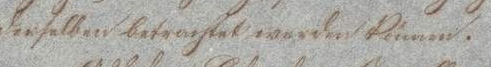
derselben betrachtet werden können.
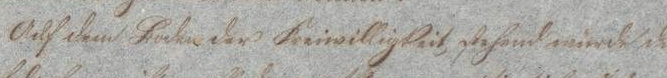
Auf dem Boden der Freiwilligkeit stehend würde die
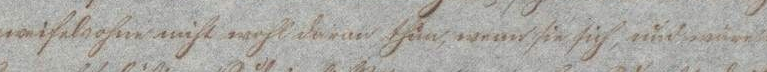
zweifelsohne nicht wohl deren thun, wenn sie sich, und wäre es
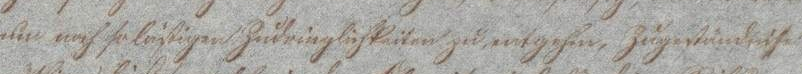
um noch so lästigen Zudringlichkeiten zu entgehen, Zugeständnisse
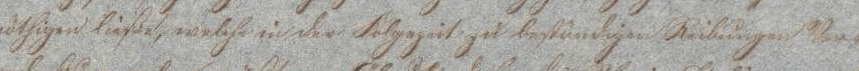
nöthigen ließe, welche in der Folgezeit zu beständigen Reibungen Ver-
